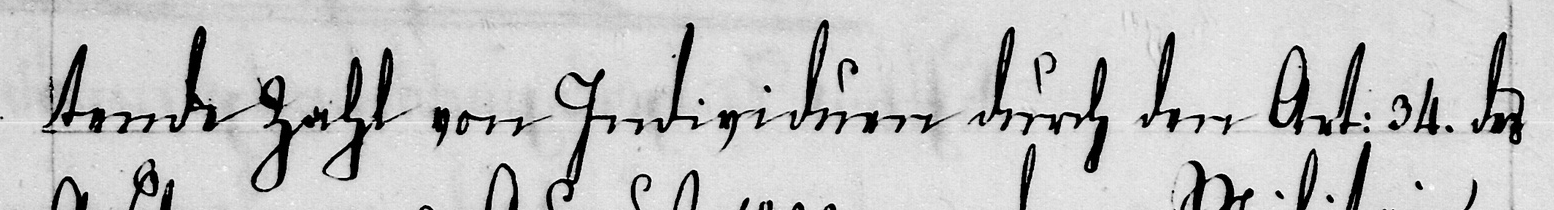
tende Zahl von Individuen durch den Art: 34. des
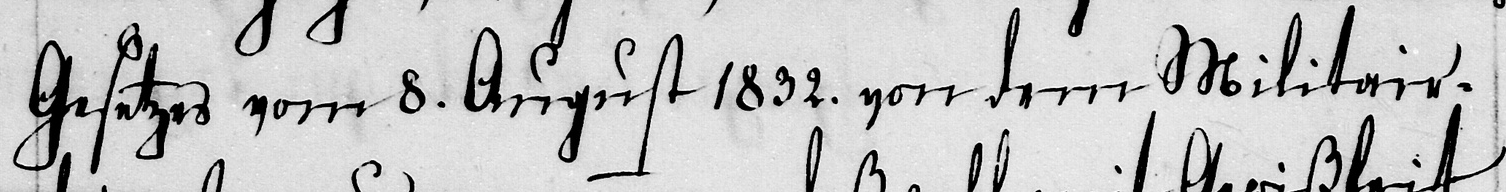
Gesetzes vom 8. August 1832. von dem Militair¬
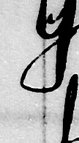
nd¬
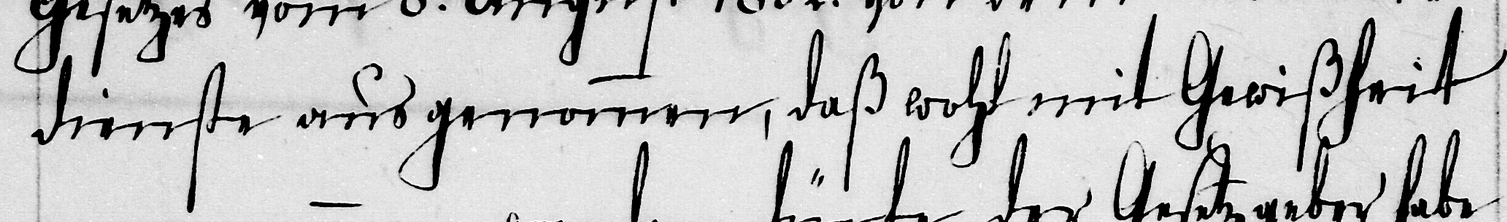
dienste ausgenommen, daß wohl mit Gewißheit
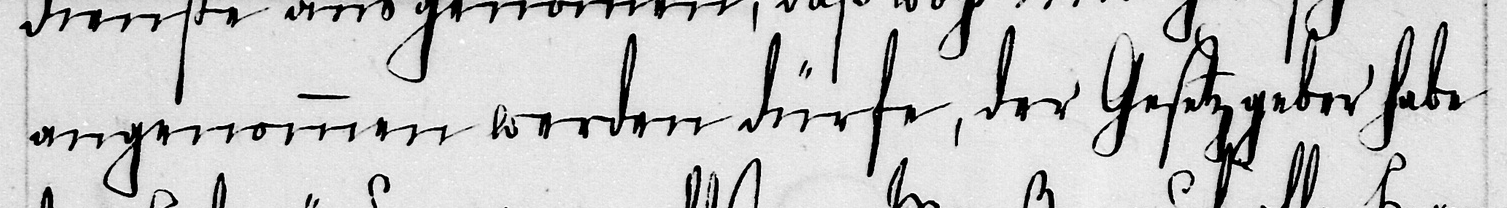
angenommen werden dürfe, der Gesetzgeber habe
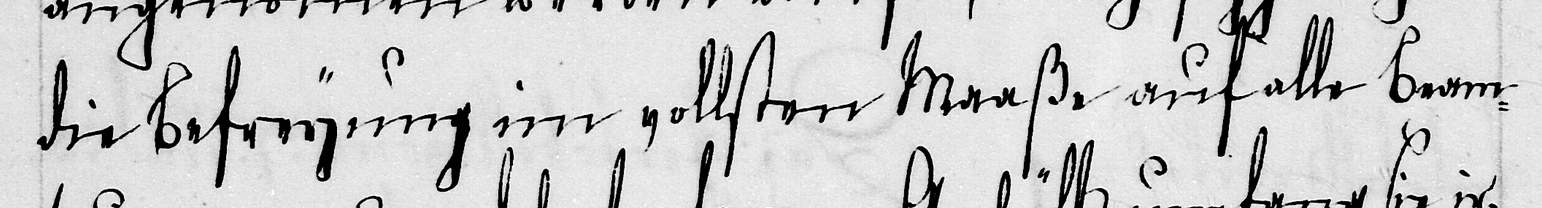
die Befreyung im vollsten Maaße auf alle Beam¬
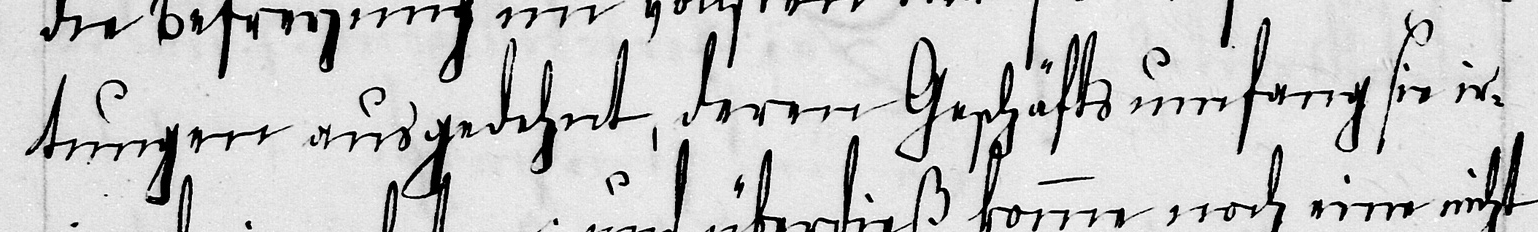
tungen ausgedehnt, deren Geschäftsumfang sie ir¬
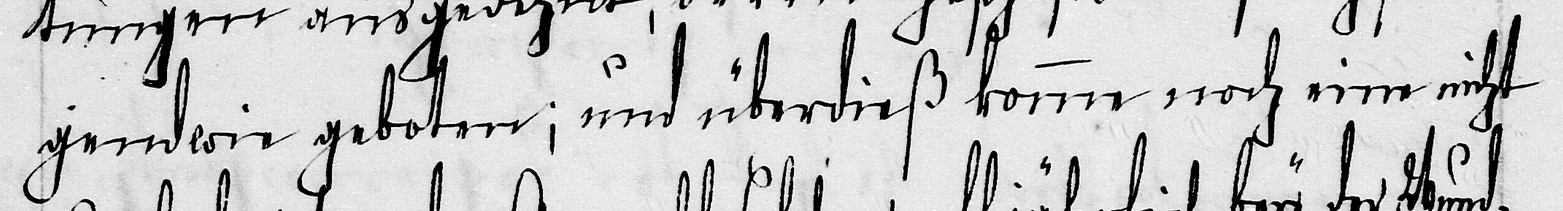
gendwie geboten; und überdieß komme noch eine nicht
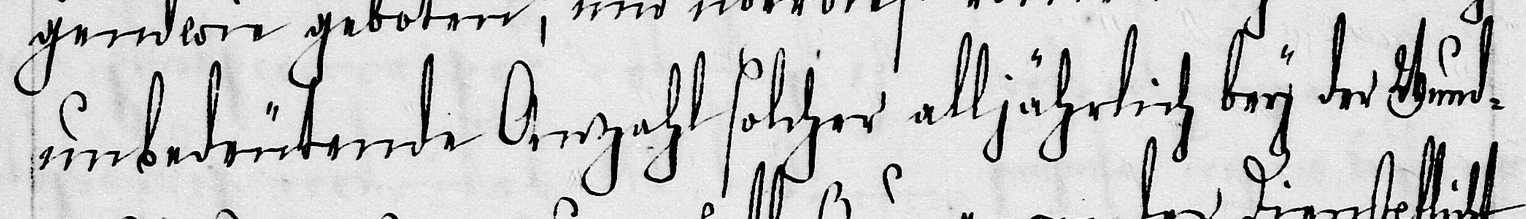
unbedeutende Anzahl solcher alljährlich bey der Wu¬
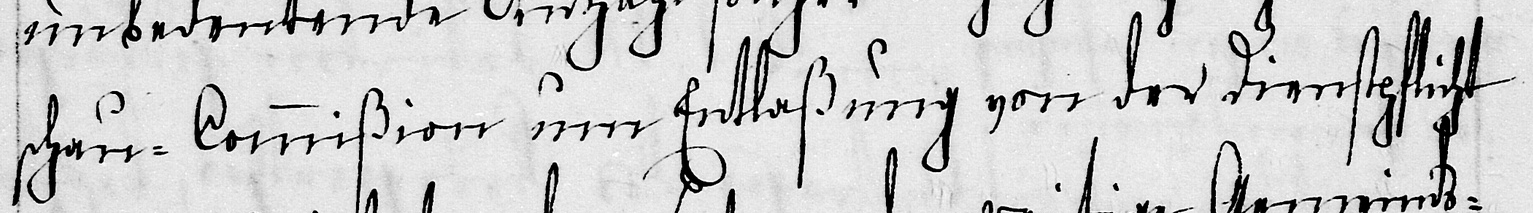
schau-Commißion um Entlaßung von der Dienstpflicht
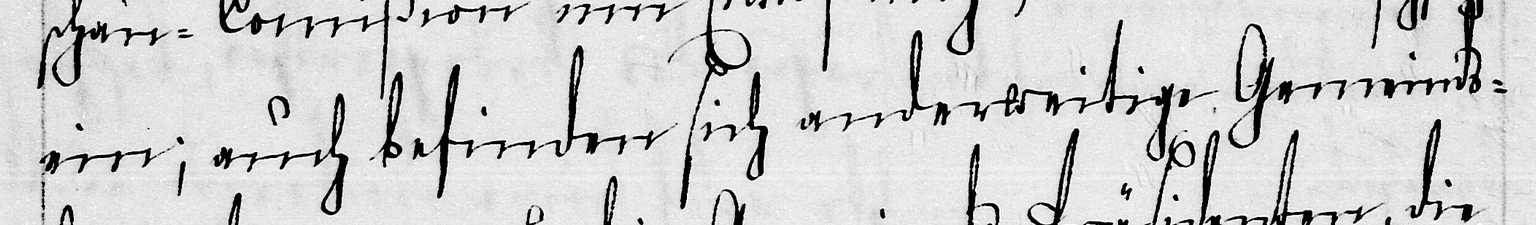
ein; auch befinden sich anderweitige Gemeinds¬
